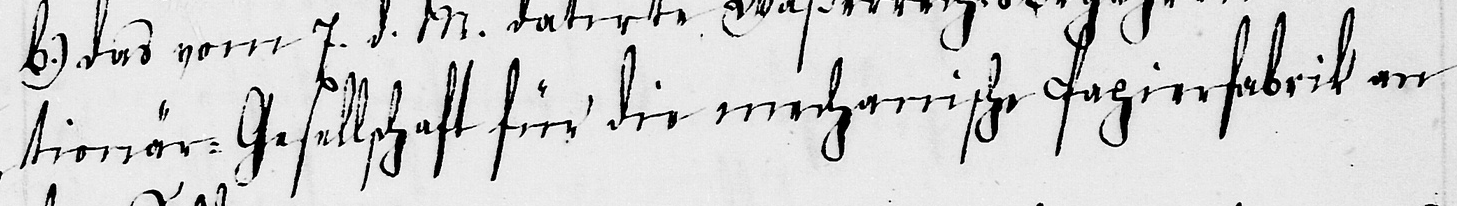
tionär-Gesellschaft für die mechanische Papierfabrik an
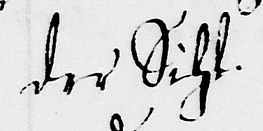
der Sihl.
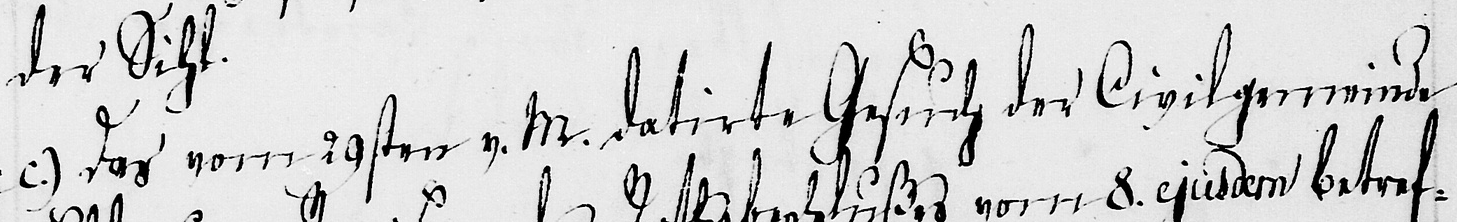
c.) Das vom 29sten v. M. datirte Gesuch der Civilgemeinde
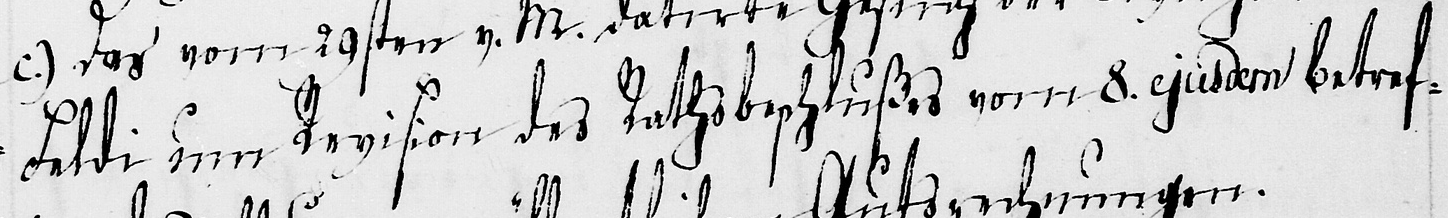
Feldi um Revision des Rathsbeschlußes vom 8. ejusdem betref¬
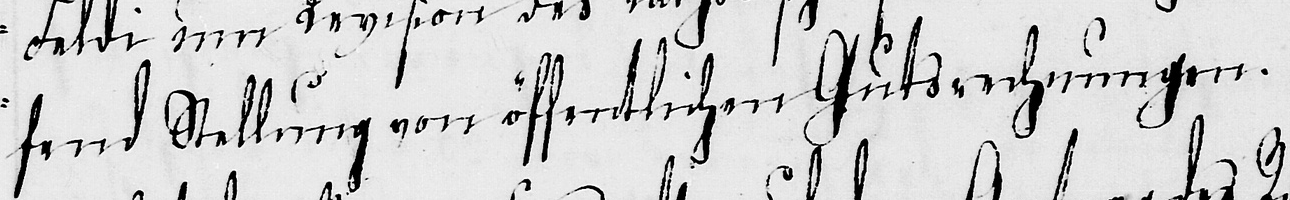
fend Stellung von öffentlichen Gutsrechnungen.
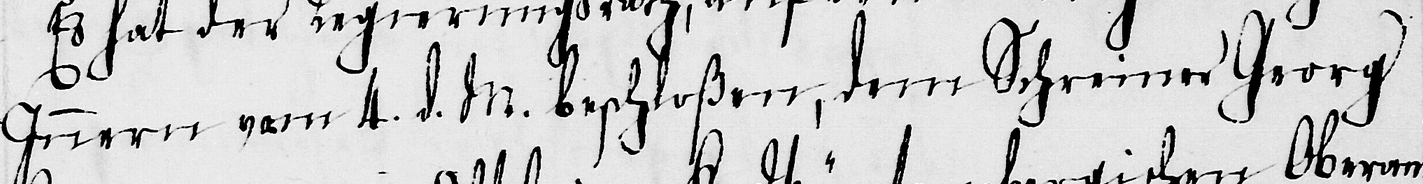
Innern vom 4. d. M. beschloßen, dem Schreiner Georg
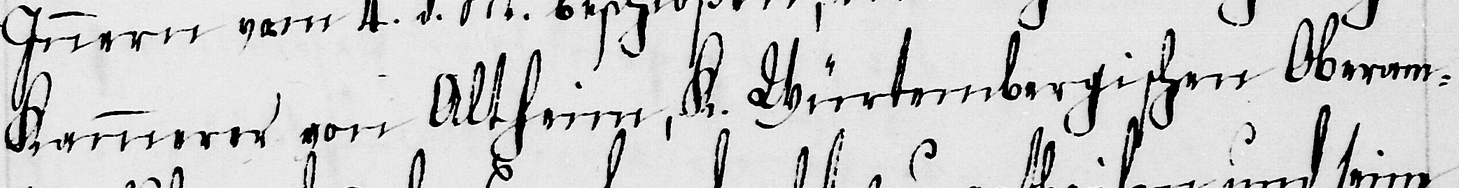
Kammerer von Altheim, K. Würtembergischen Oberam¬
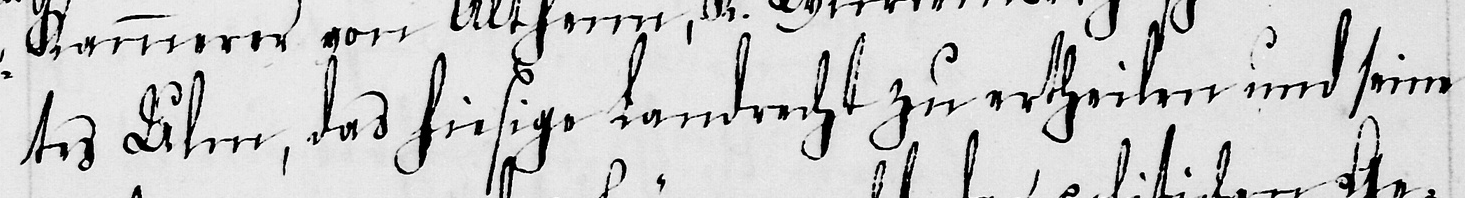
tes Ulm, das hiesige Landrecht zu ertheilen und seine
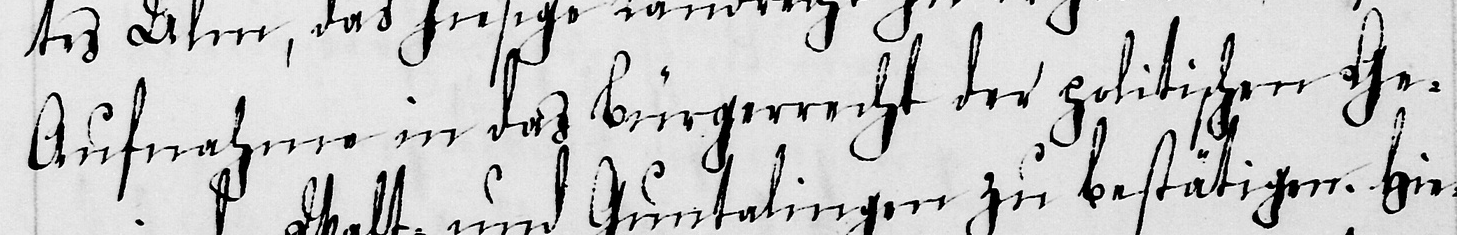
Aufnahme in das Bürgerrecht der politischen Ge¬
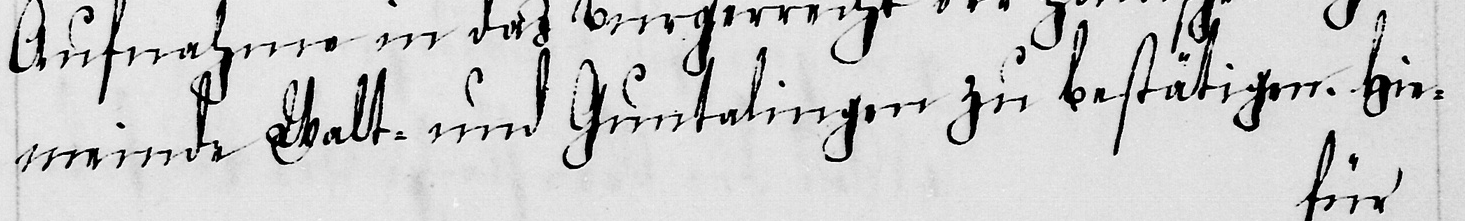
meinde Walt-und Guntalingen zu bestätigen. Hie-
